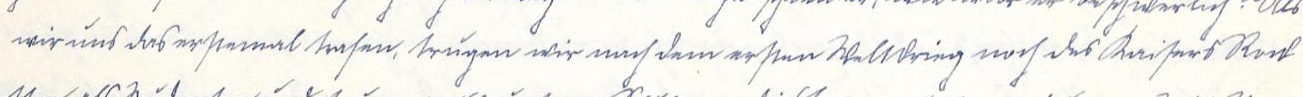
wir uns das erstemal trafen, trugen wir nach dem ersten Weltkrieg noch des Kaisers Rock
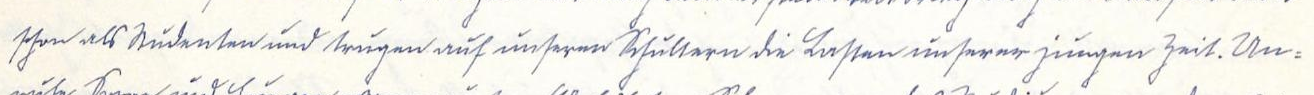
schon als Studenten und trugen auf unseren Schultern die Lasten unserer jungen Zeit. Un-
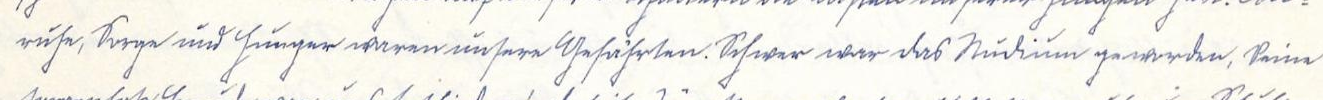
ruhe, Sorge und Hunger waren unsere Gefährten. Schwer war das Studium geworden, keine
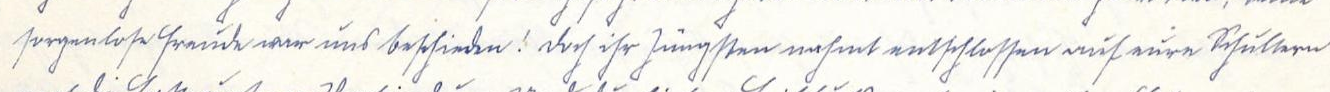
sorgenlose Freude war uns beschieden! Doch ihr Jüngsten nahmt entschlossen auf eure Schultern
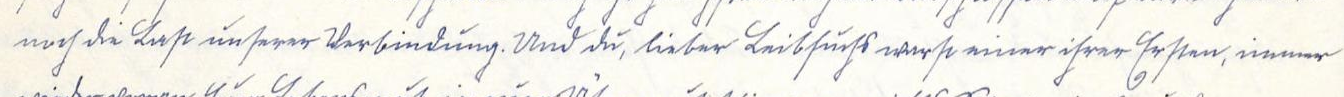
noch die Last unserer Verbindung. Und du, lieber Leibfuchs warst einer ihrer Ersten, immer
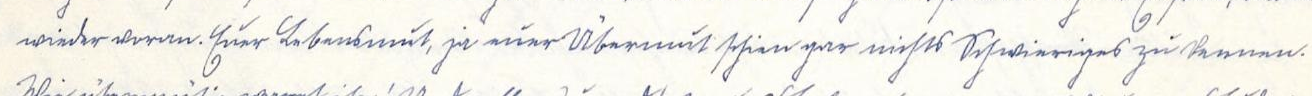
wieder voran. Euer Lebensmut, ja euer Übermut schien gar nichts Schwieriges zu kennen.
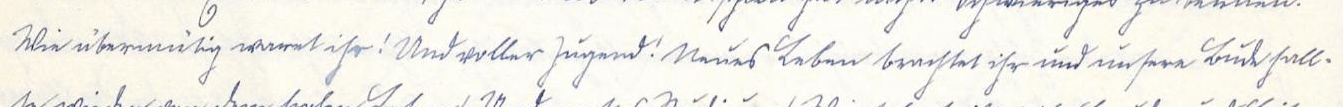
Wie übermütig waret ihr! Und voller Jugend. Neues Leben brachte ihr und unsere Bunde hall-
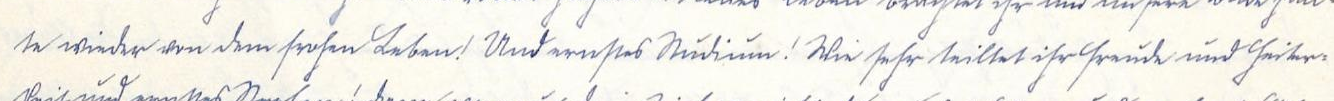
te wieder von dem frohen Leben! Und ernstes Studium! Wie sehr teiltet ihr Freude und Heiter-
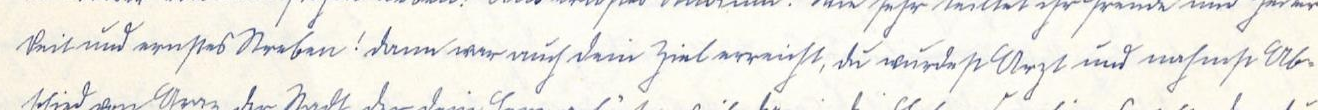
keit und ernstes Streben! Dann war auch dein Ziel erreicht, du wurdest Arzt und nahmst Ab-
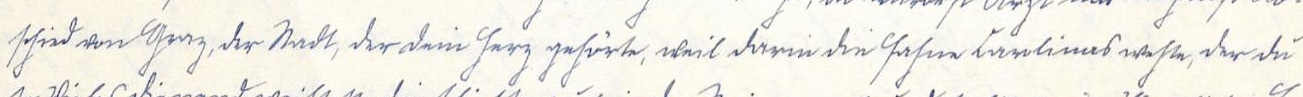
schied von Graz, der Stadt, der Dein Herz gehörte, weil darin die Fahne Carolinas wehte, der du
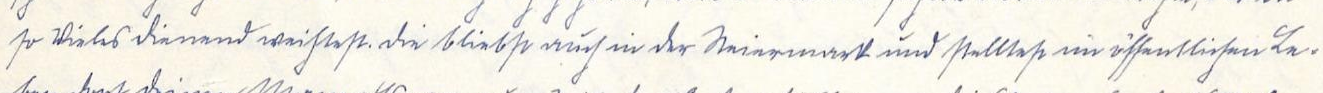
so vieles dienend weihtest. Du bliebst auch in der Steiermark und stelltest im öffentlichen Le-
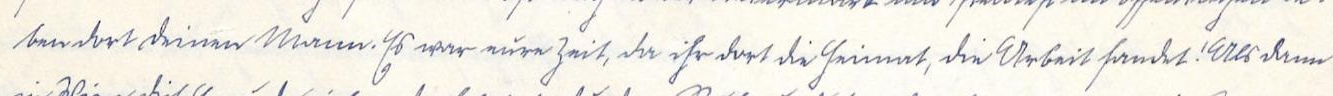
ben dort deinen Mann. Es war eure Zeit, da ihr dort die Heimat, die Arbeit fandet! Als dann
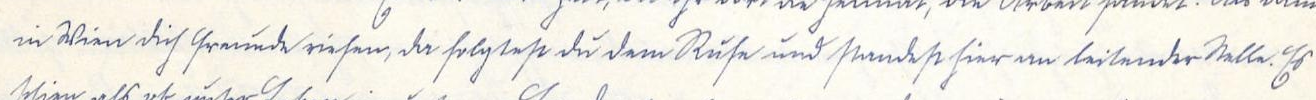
in Wien dich Freunde riefen, da folgtest du dem Rufe und standest hier an leitender Stelle . Es
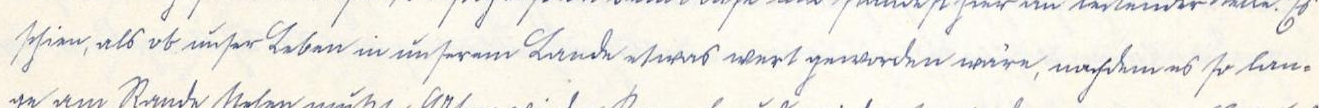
schien, als ob unser Leben in unserem Lande etwas wert geworden wäre, nachdem es so lan-
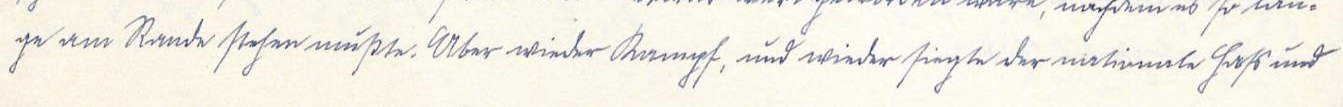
ge am Rand stehen musste. Aber wieder Kampf, und wieder siegte der nationale Hass und
